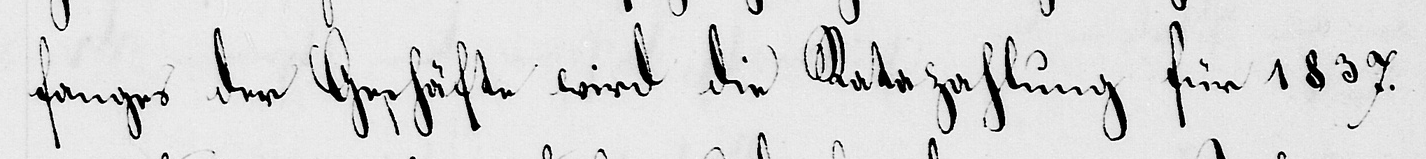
fanges der Geschäfte wird die Ratazahlung für 1837.
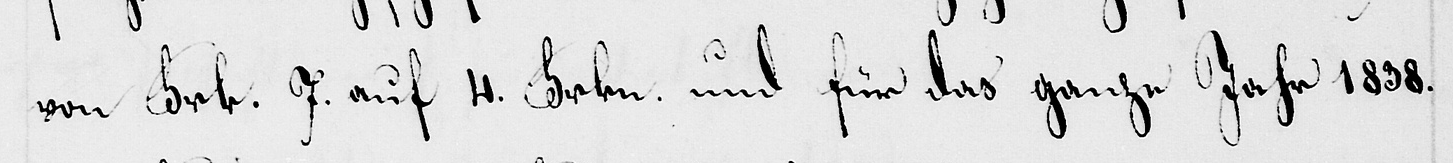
von Frk. 7. auf 4. Frkn. und für das ganze Jahr 1838.
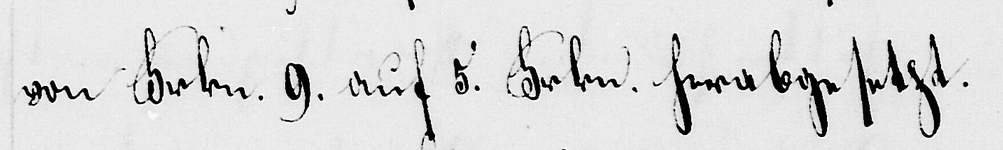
von Frkn. 9. auf 5. Frkn. herabgesetzt.
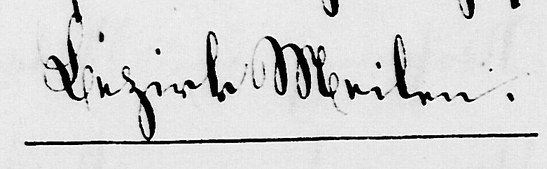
Bezirk Meilen.
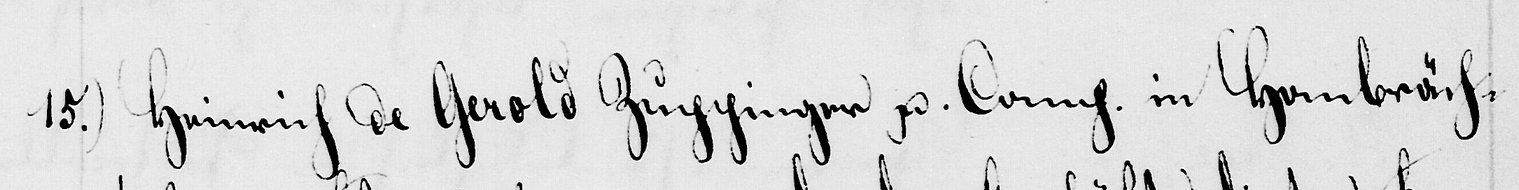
15.) Heinrich de Gerold Zuppinger u. Comp. in Hombräch¬
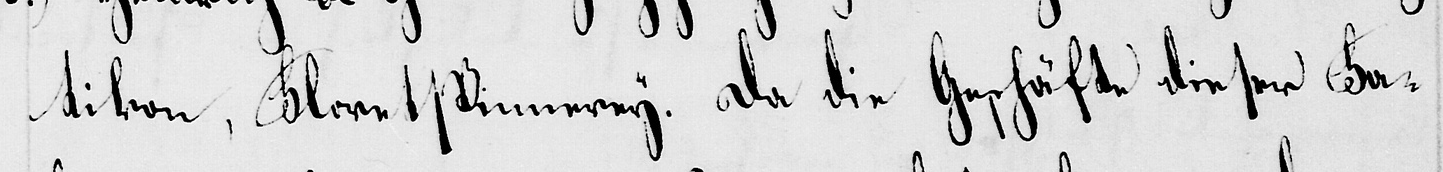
tikon, Floretspinnerey. Da die Geschäfte dieser Fa¬
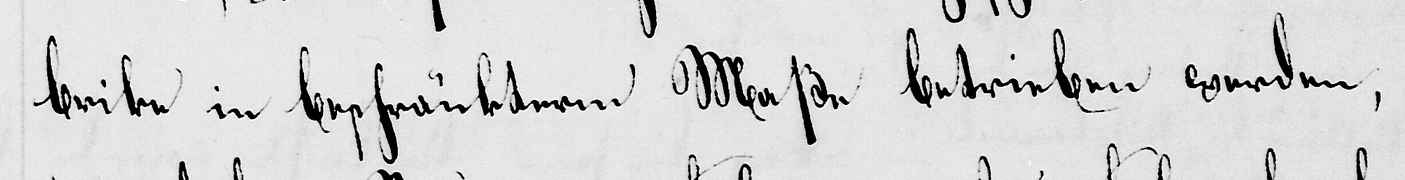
brike in beschränkterm Maße betrieben werden,
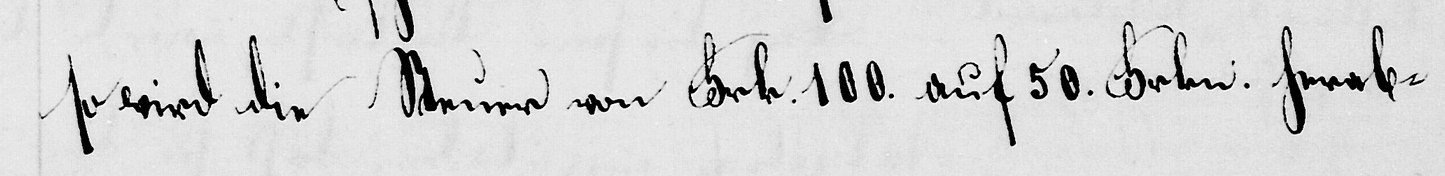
so wird die Steuer von Frk. 100. auf 50. Frkn. herab¬
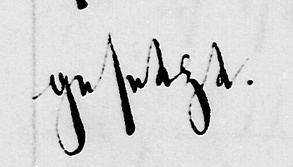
gesetzt.
